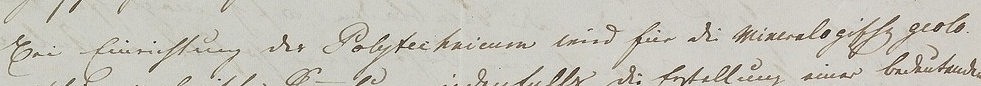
Bei Einrichtung des Polytechnicum wird für die mineralogische, geolo-
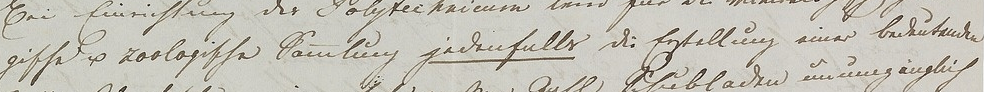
gische & zoologische Sammlung jedenfalls die Erstellung einer bedeutenden
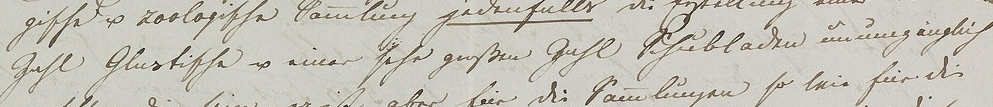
Zahl Glastische & einer sehr großen Zahl Schubladen unumgänglich
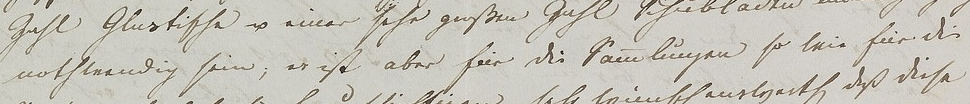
nothwendig sein; es ist aber für die Sammlungen so wie für die
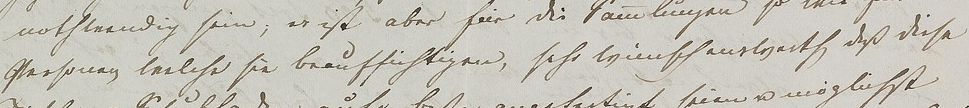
Personen, welche sie beaufsichtigen, sehr wünschenswerth, daß diese
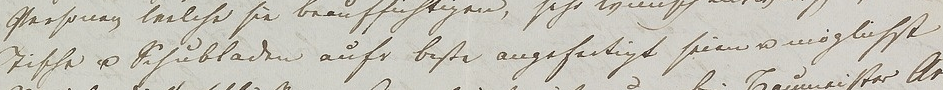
Tische & Schubladen aufs beste angefertigt seien & möglichst
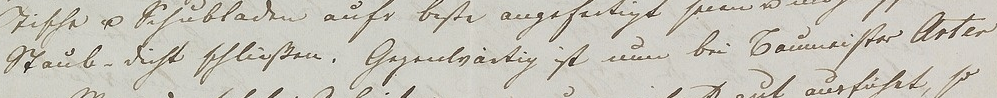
Staub-dicht schließen. Gegenwärtig ist nun bei Baumeister Arter
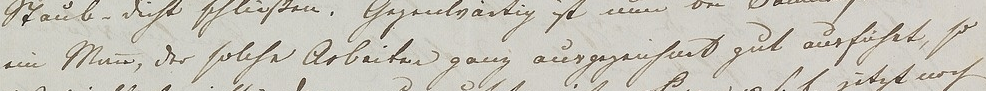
ein Mann, der solche Arbeiten ganz ausgezeichnet gut ausführt, so
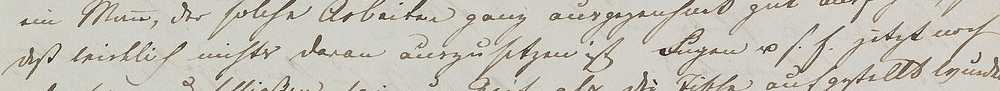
daß wirklich nichts daran auszusetzen ist, Fugen us. f. jetzt noch
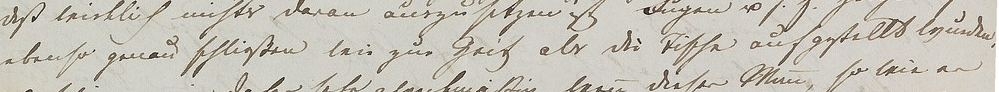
ebenso genau schließen wie zur Zeit, als die Tische aufgestellt wurden.
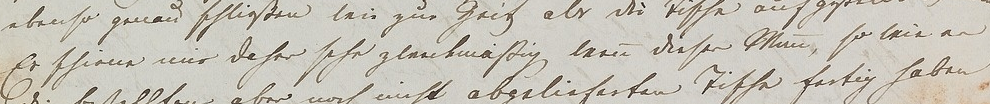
Es schiene mir daher sehr zweckmäßig, wenn dieser Mann, so wie er
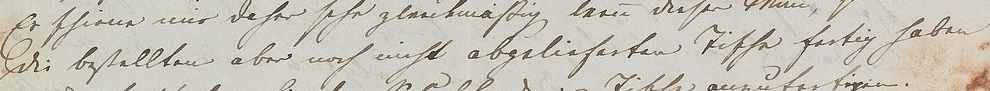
die bestellten aber noch nicht abgelieferten Tische fertig haben
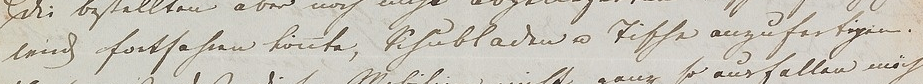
wird, fortfahren könnte, Schubladen & Tische anzufertigen.
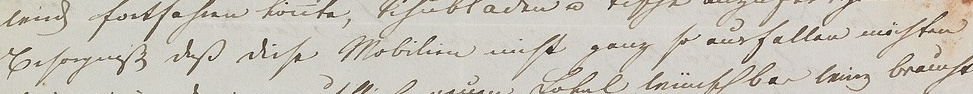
Besorgniß, daß diese Mobilien nicht ganz so ausfallen möchten
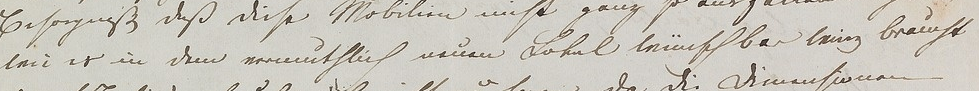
wie es in dem vermuthlich neuen Lokal wünschbar wäre, braucht
